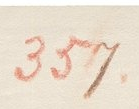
Mars.
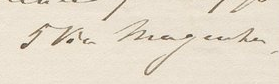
5 Via Magenta.
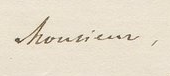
Monsieur
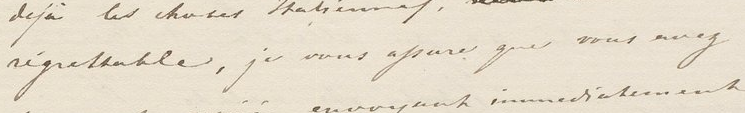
régrettable, je vous assure que vous avez
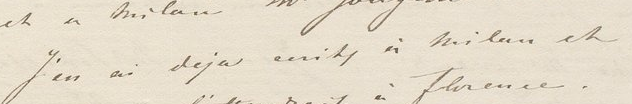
J'en ai deja ecrits à Milan et
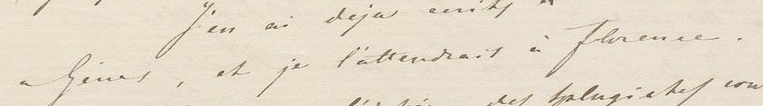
a Gênes, et je l'attendrais à Florence.
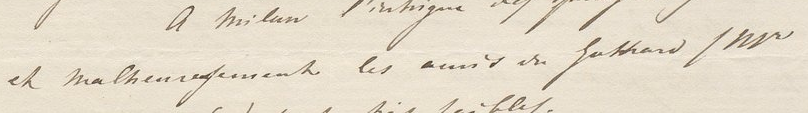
et malheuresement les amis du Gothard (Mr
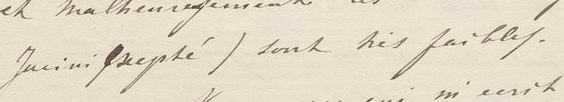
Jacini excepté) sont très faibles.
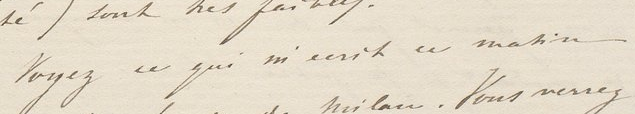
Voyez ce qui m'ecrit ce matin
